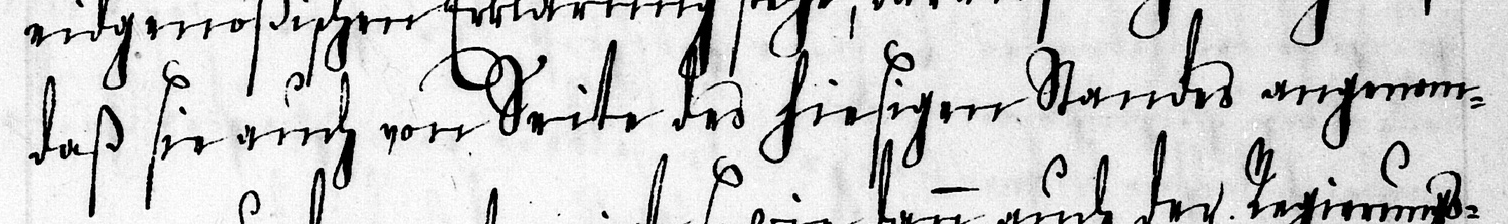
daß sie auch von Seite des hiesigen Standes angenom¬
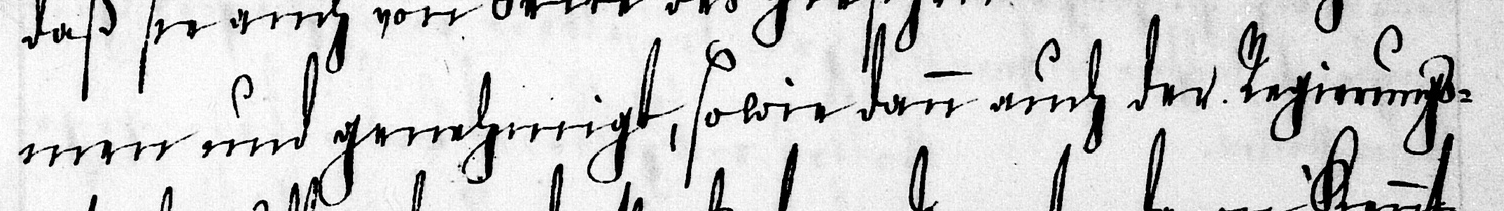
men und genehmigt, sowie dann auch der Regierungs¬
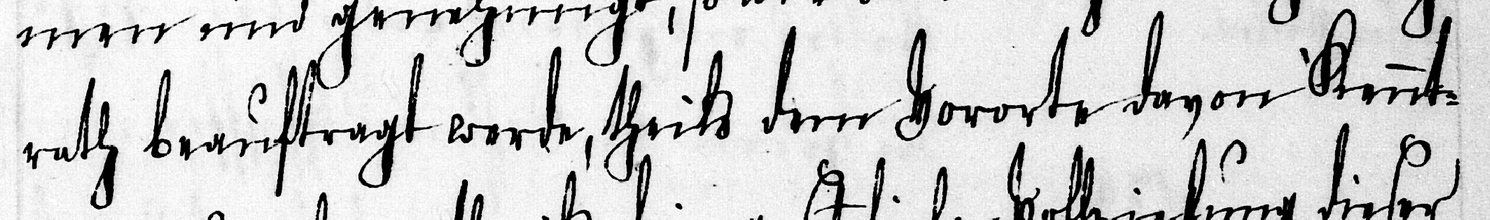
rath beauftragt werde, theils dem Vororte davon Kennt¬
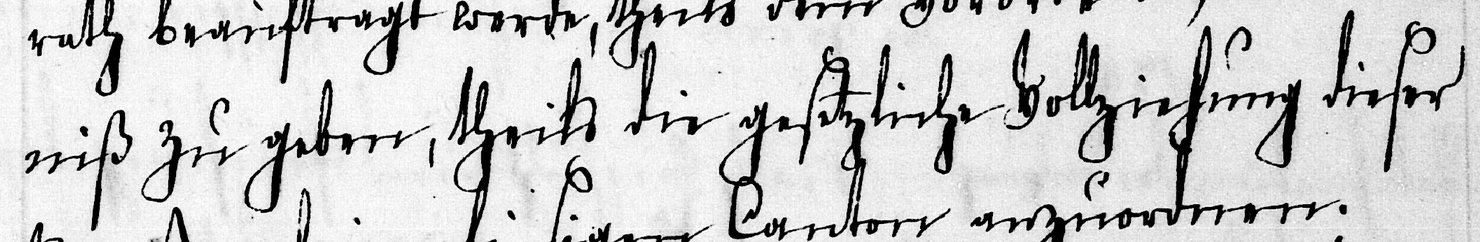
niß zu geben, theils die gesetzliche Vollziehung dieser
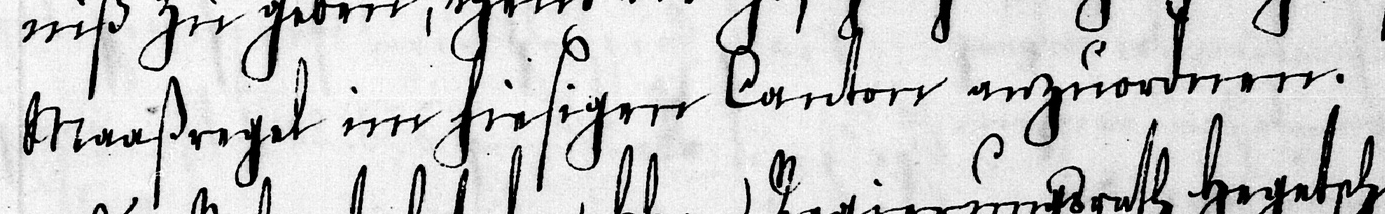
Maaßregel im hiesigen Canton anzuordnen.
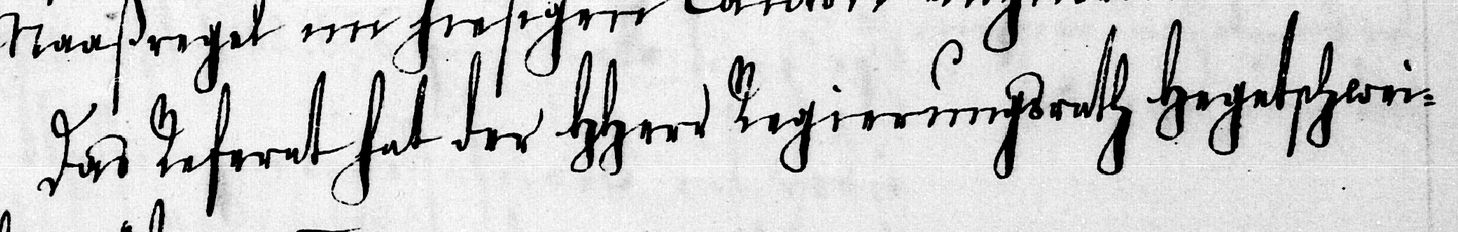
Das Referat hat der HHerr Regierungsrath Hegetschwei¬
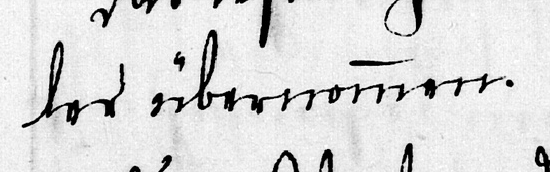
ler übernommen.
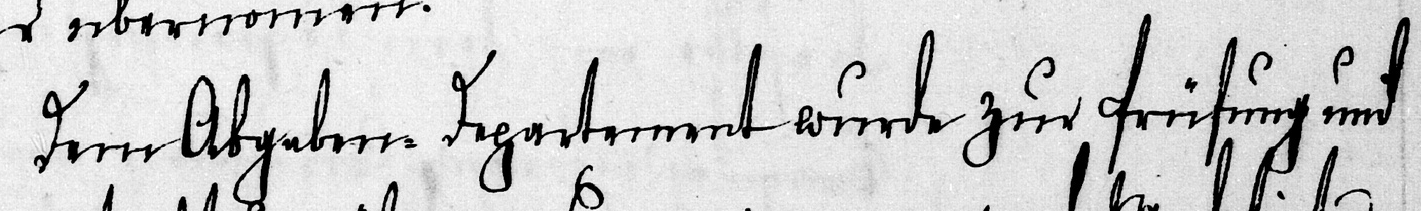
Dem Abgaben-Departement wurde zur Prüfung und
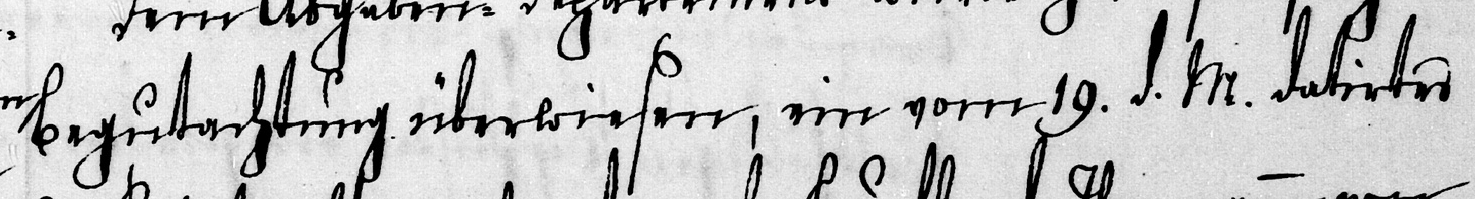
Begutachtung überwiesen, ein vom 19. d. M. datirtes
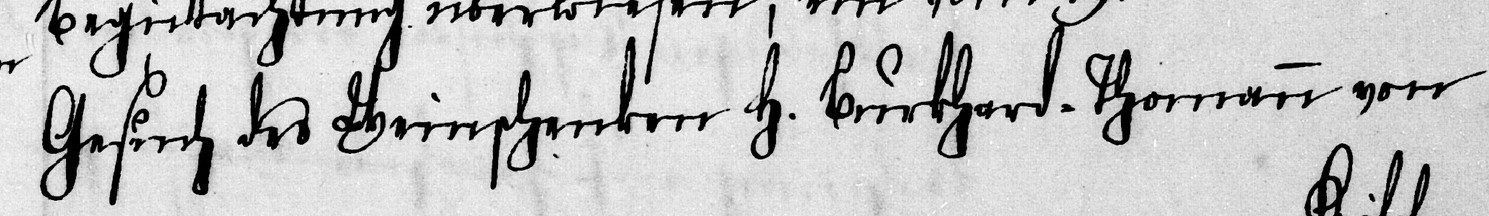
Gesuch des Weinschenken H. Burkhard-Thomann von
